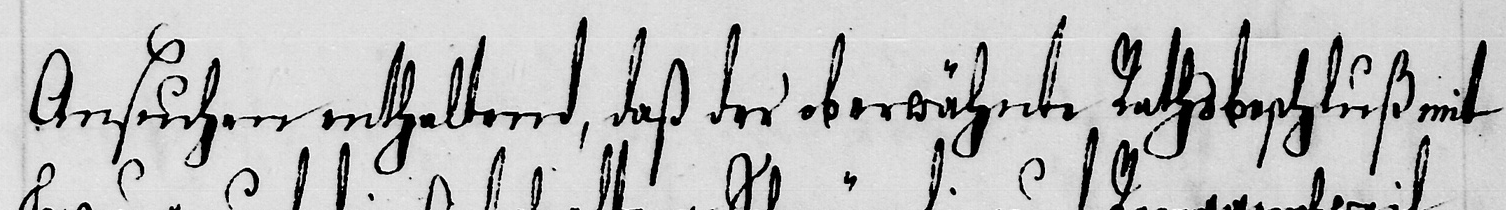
Ansuchen enthaltend, daß der oberwähnte Rathsbeschluß mit
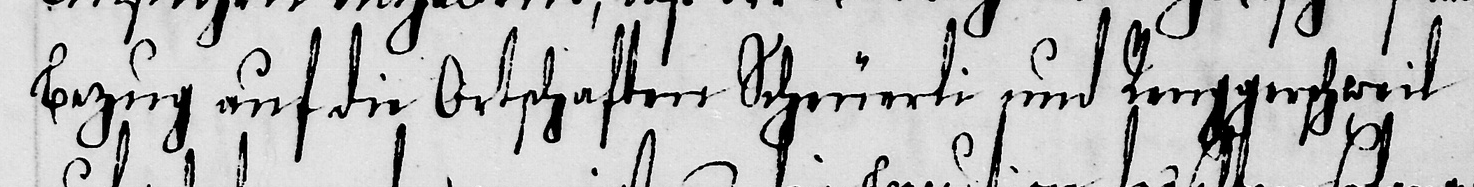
Bezug auf die Ortschaften Scheuerli und Renggerschweil
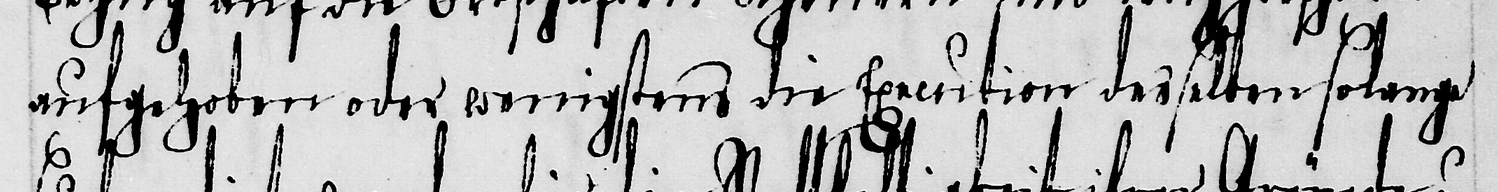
aufgehoben oder wenigstens die Execution desselben solange
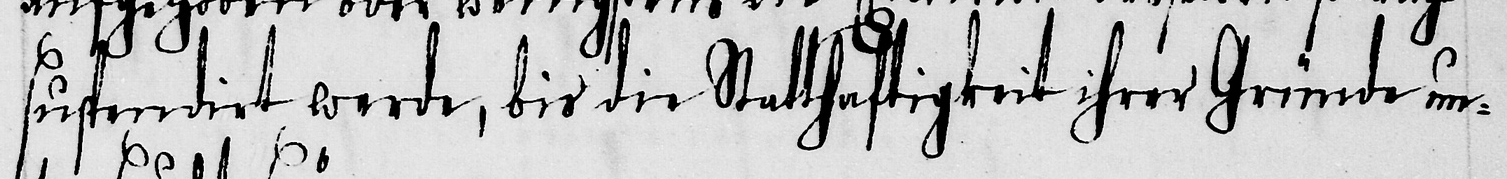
suspendirt werde, bis die Statthaftigkeit ihrer Gründe un¬
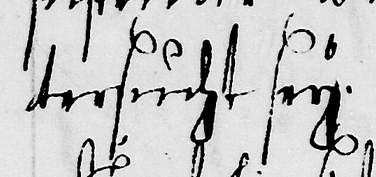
tersucht sey.
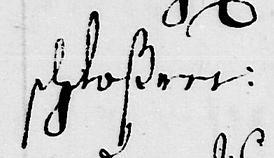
schloßen:
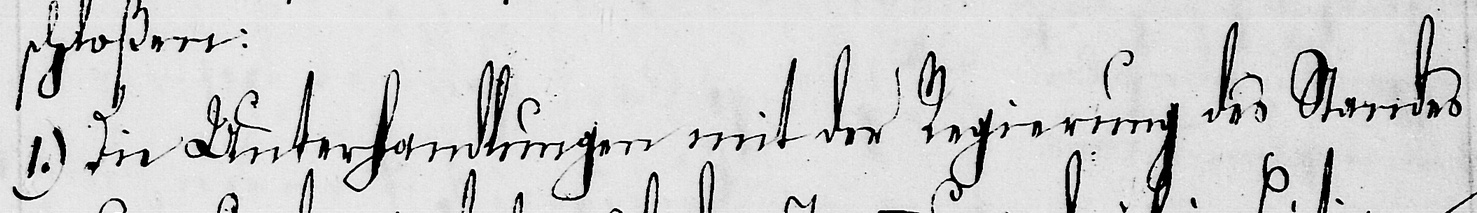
1.) Die Unterhandlungen mit der Regierung des Standes
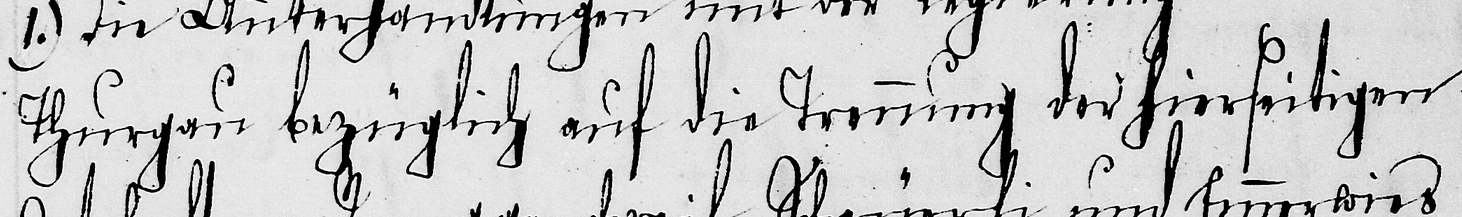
Thurghau bezüglich auf die Trennung der hierseitigen
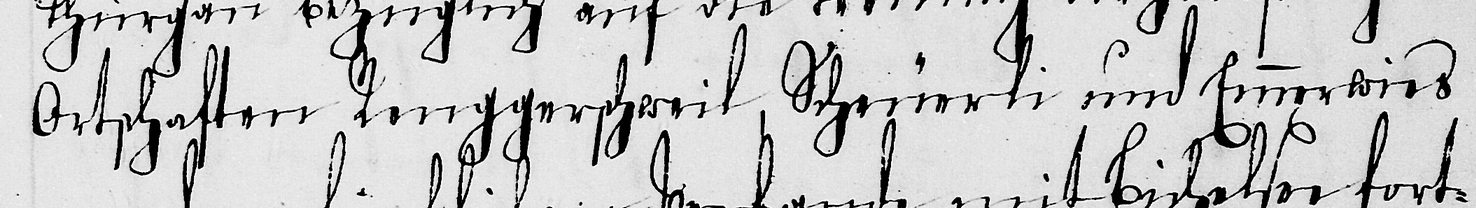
Ortschaften Renggerschweil, Scheuerli und Emmerwies
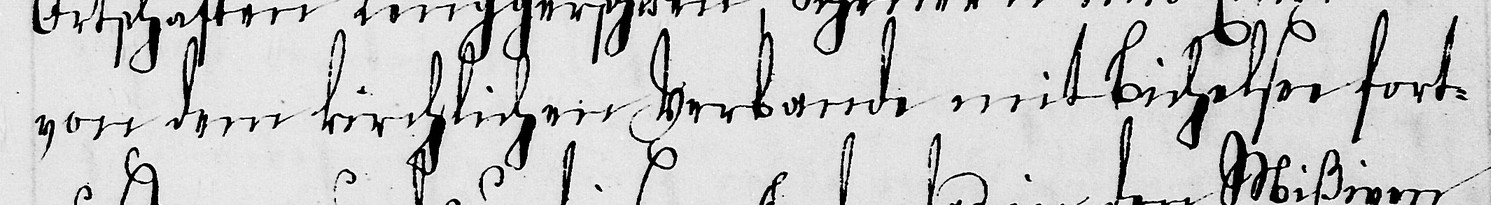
von dem kirchlichen Verbande mit Bichelsee fort¬
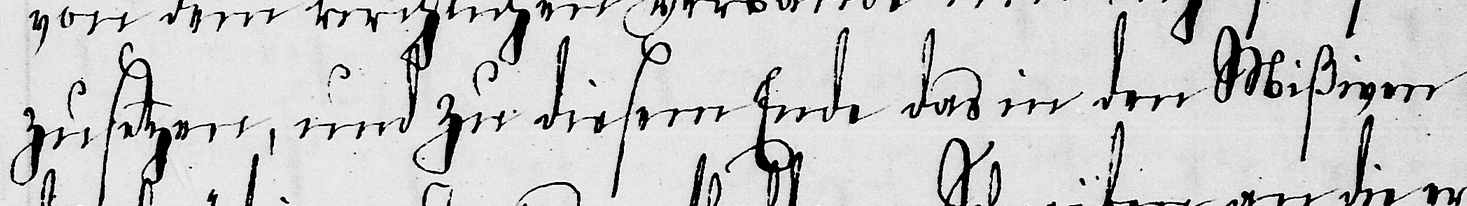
zusetzen, und zu diesem Ende das in den Mißiven
